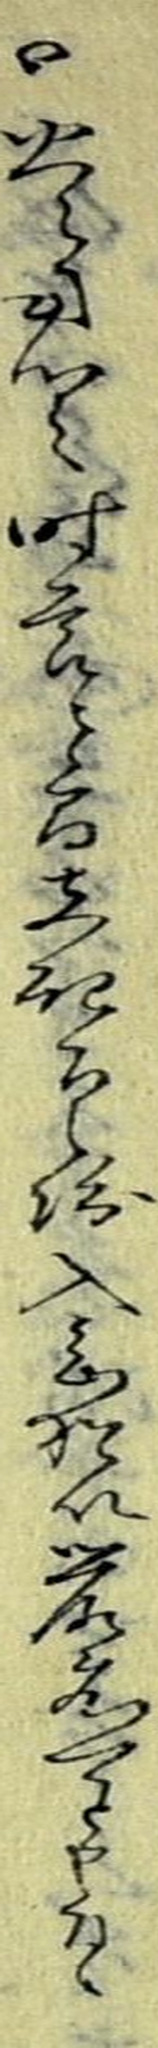〇火之用心之時節に候間支配下之儀入念猶以厳敷可申付候

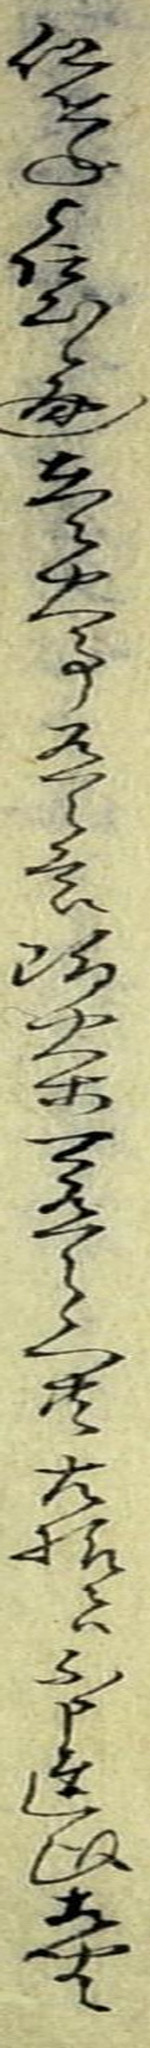但近年被仰出候通在々火事有之節附火等可有之候へ共左様には不申達趣相聞候
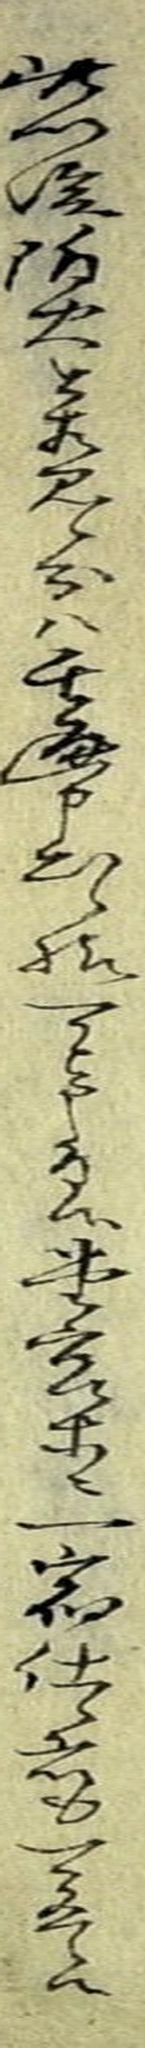此以後附火と相見候分は其通申出候様可被申付候堂宮等に一宿仕候者も可有之候
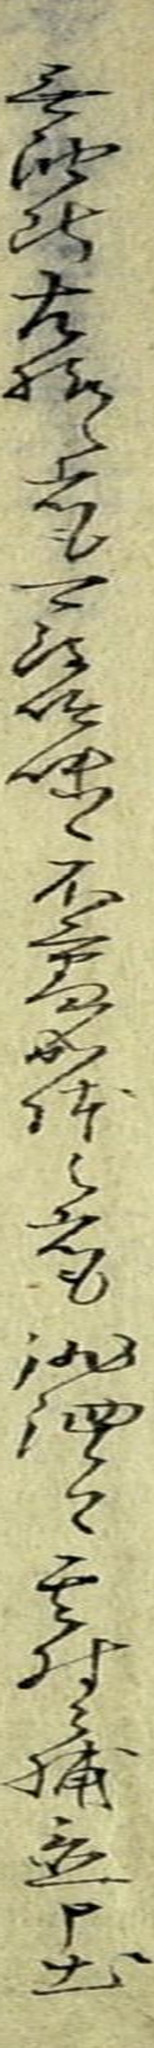無油断左様候者も可致吟味候不審成体之者も徘徊候はゝ其時々捕置申出
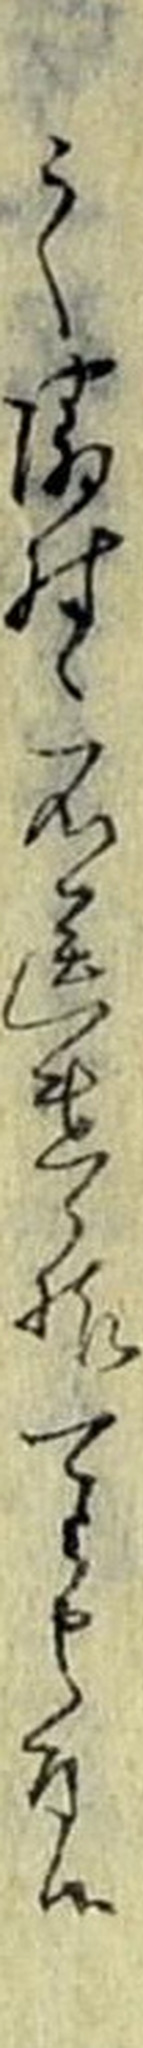之隣村へ不送遣候様可被申付候
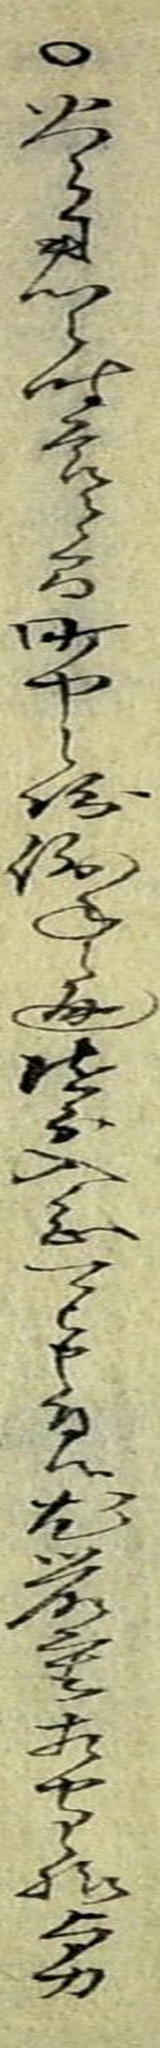〇火之用心之時節に候間町中之儀例年之通随分入念可被申付候尤厳重相守候様与力
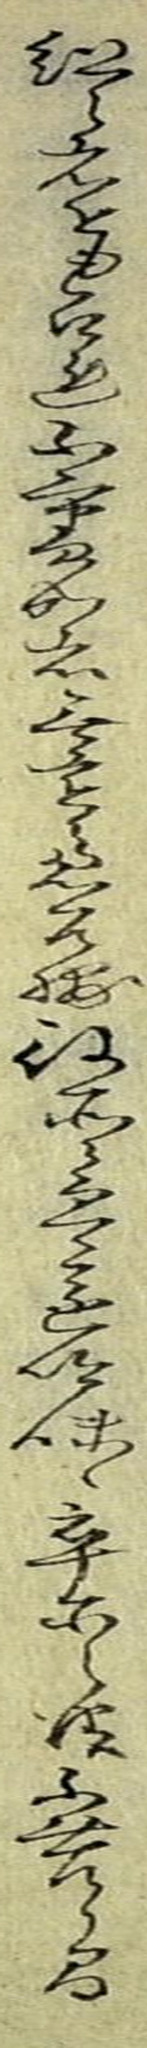組之者とも召連不審成者無遠慮召捕役所に而可遂吟味候卒爾之儀は不苦候間
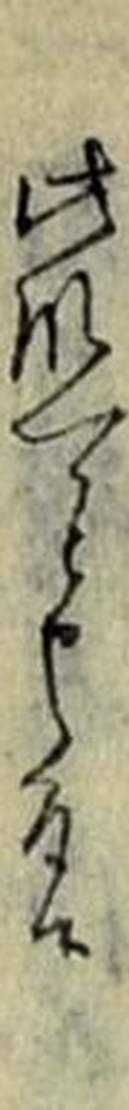此段可被申付候
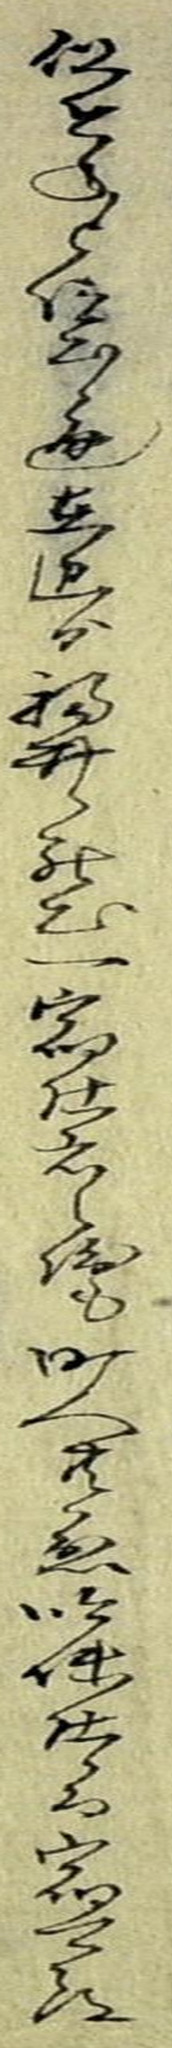但近年被仰出候通在辺ゟ福井へ罷出一宿仕者之儀も町人共愈吟味仕候而宿可致
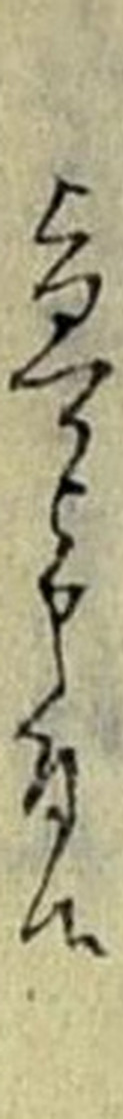此段可被申付候
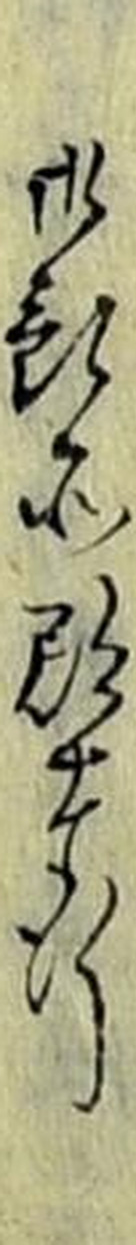御預所郡奉行
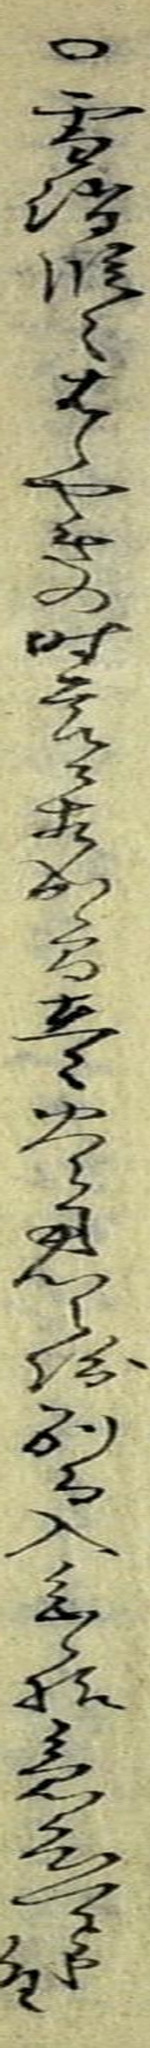〇雪消段之はしやきの時節に相成候間在々火之用心之儀別而入念候様急度可被申付候
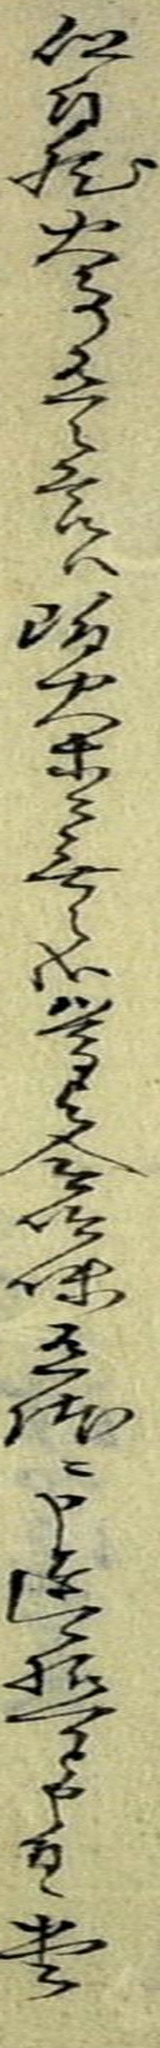但自然火事有之節は附火等に無之哉篤と令吟味有体に申達候様可被申付候堂
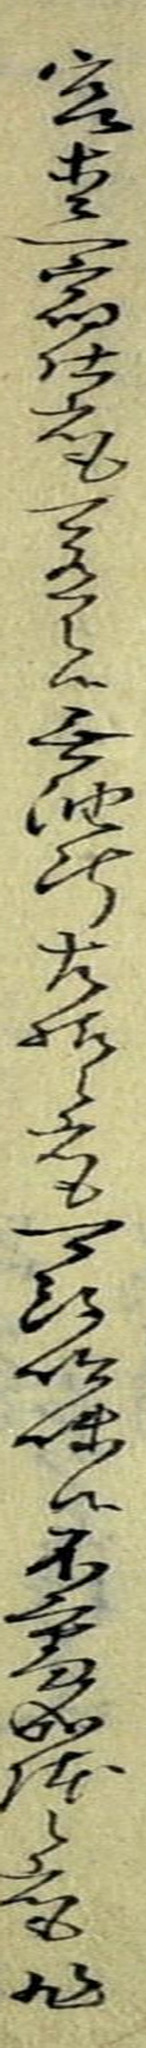宮等に一宿仕者も可有之候無油断左様之者も可致吟味候不審成体之者も徘
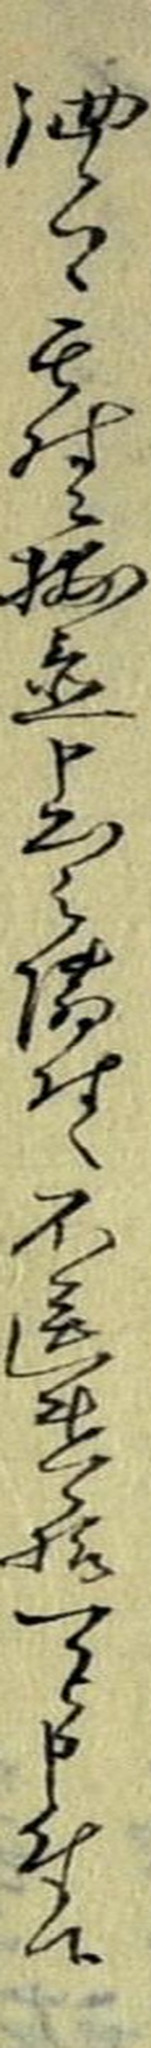徊候はゝ其村に捕置申出之隣村へ不送遣候様可被申付候
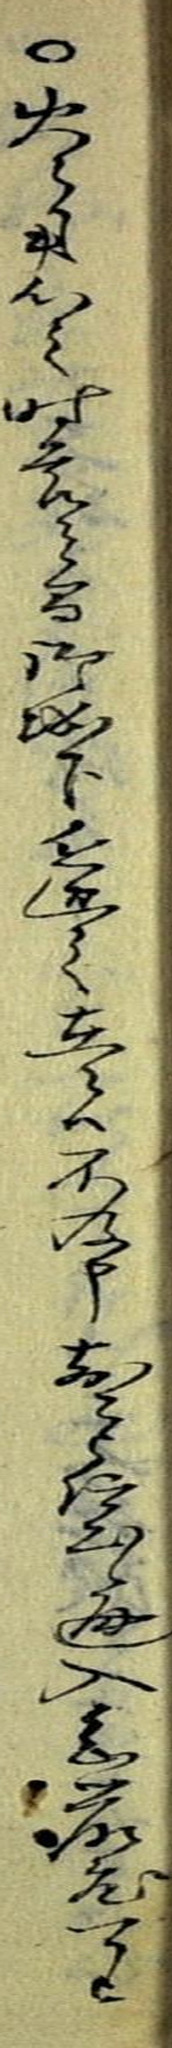〇火之用心之時節之間御城下近辺之在々は不及申前々被仰出候通入念厳敷可被
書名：命令之部 六
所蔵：福井県文書館 Fukui Prefectural Archives
